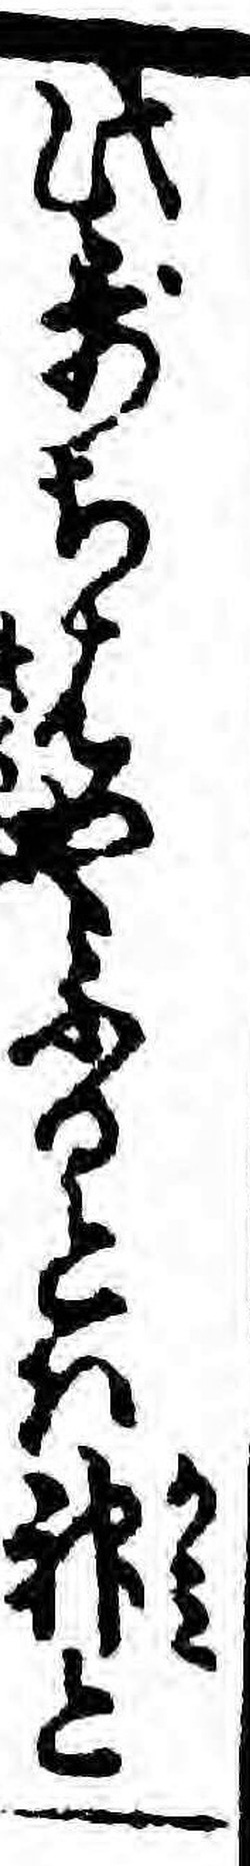此哥ちはやふるとは神と
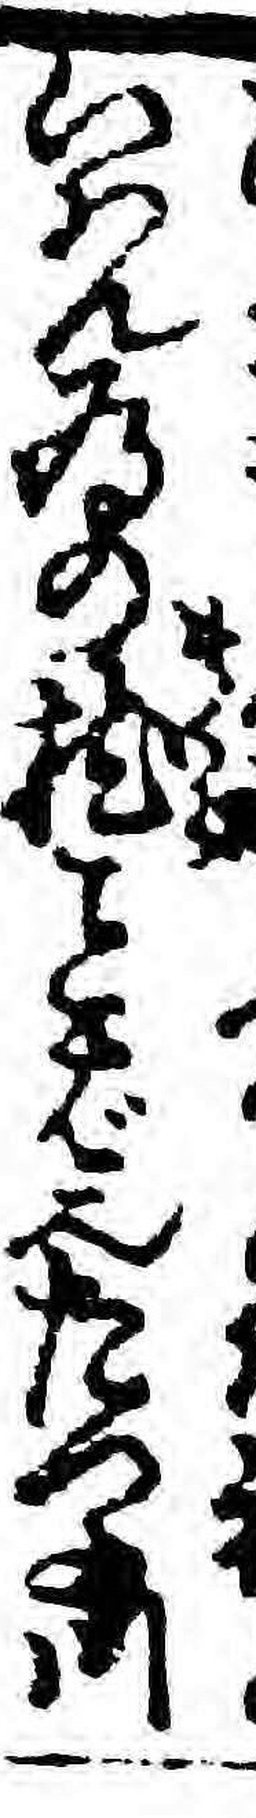いはん為の枕ことば也たつた川
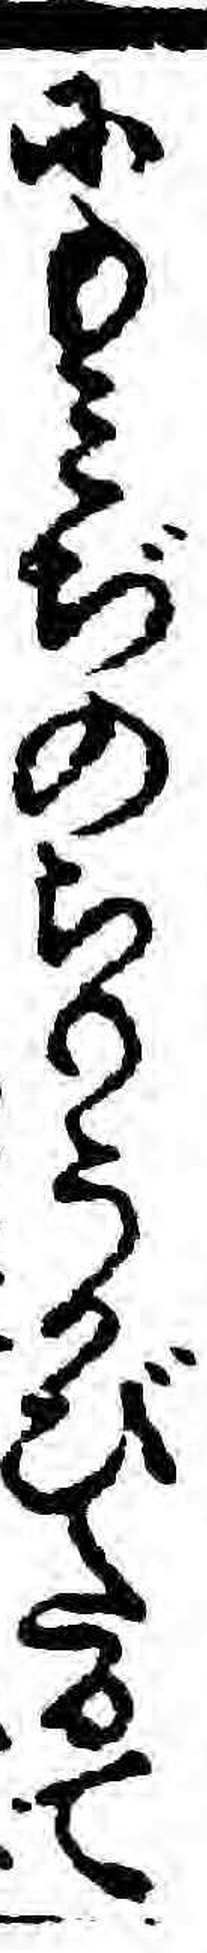にもみぢのちりうかびたるて
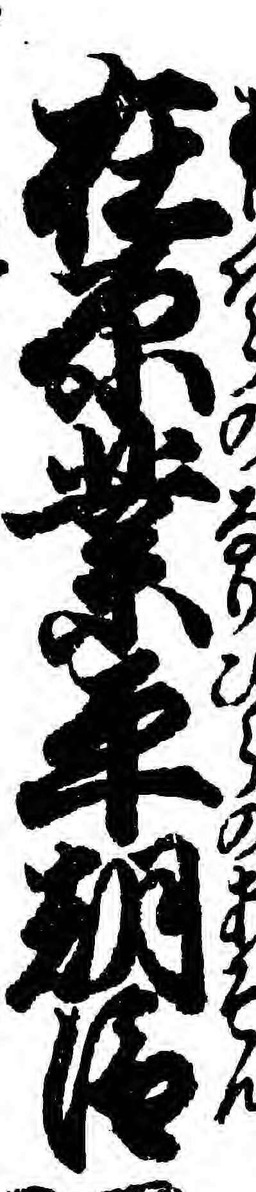在原業平朝臣
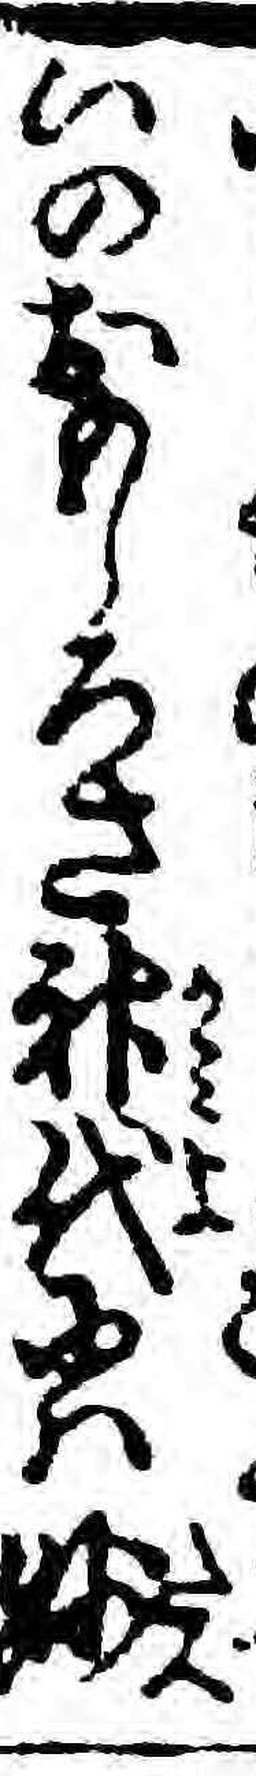いのおもしろさ神代には妙
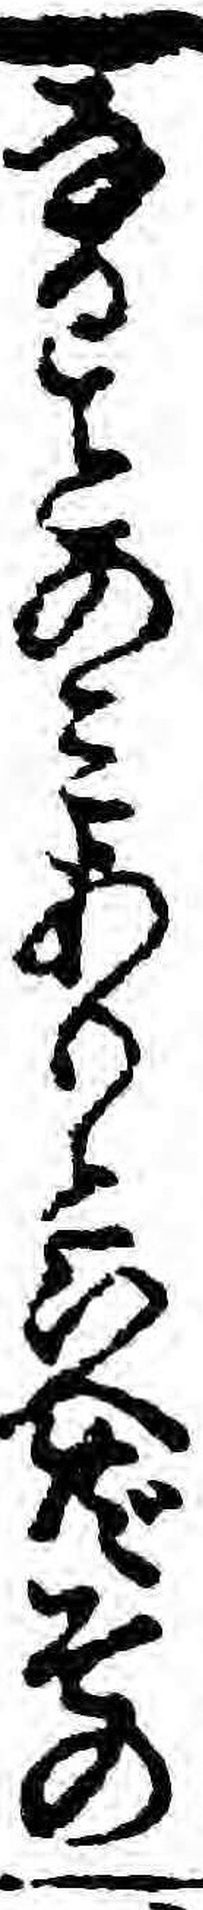なることのみありといへばその
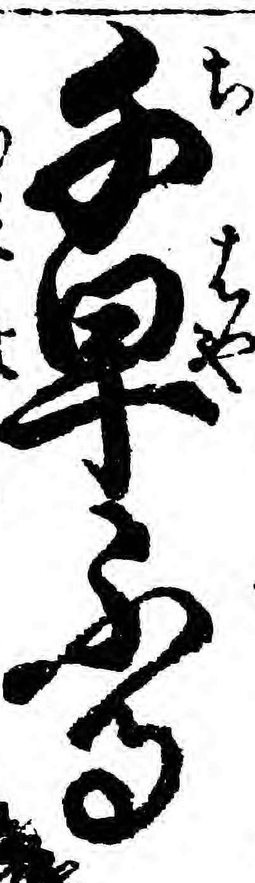千早ふる
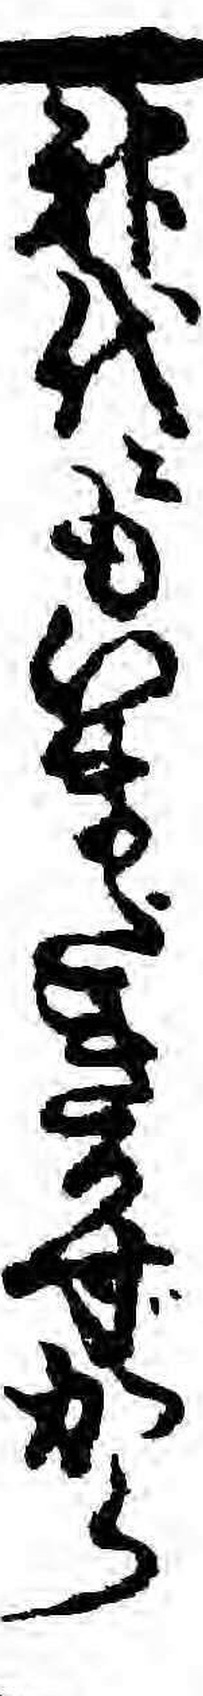神代にもいまだきかずから
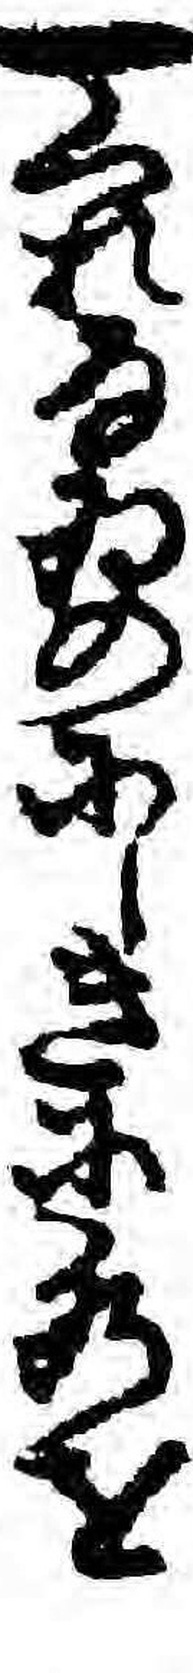くれなゐのにしきに水を
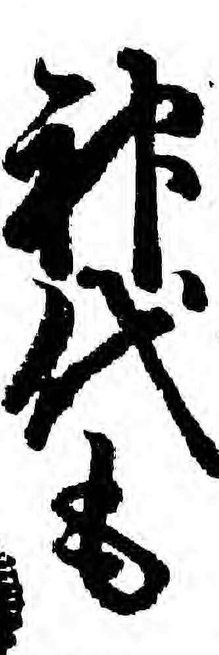神代も
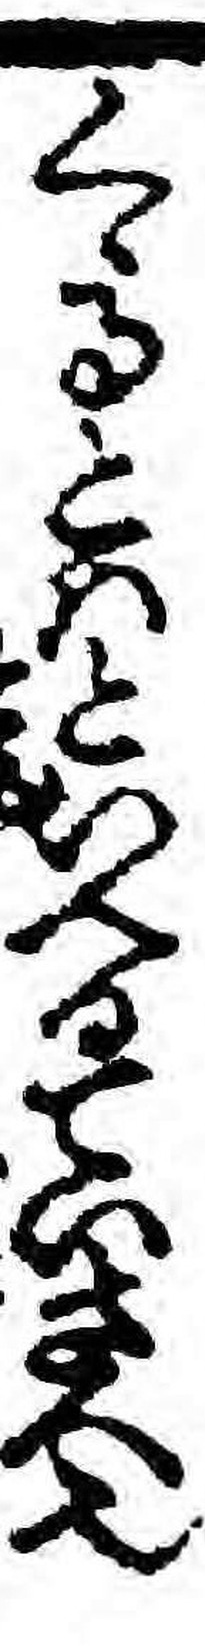くゝるとはといへるていさへ也
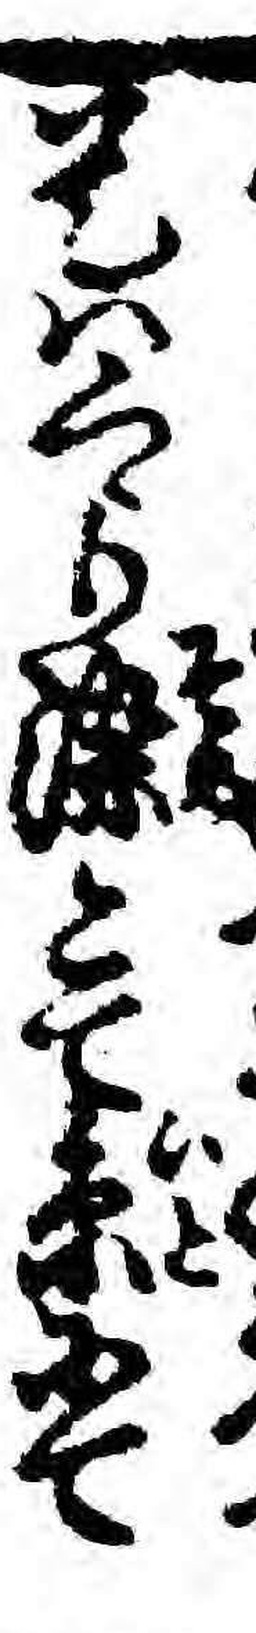是はくゝり染とて糸にて
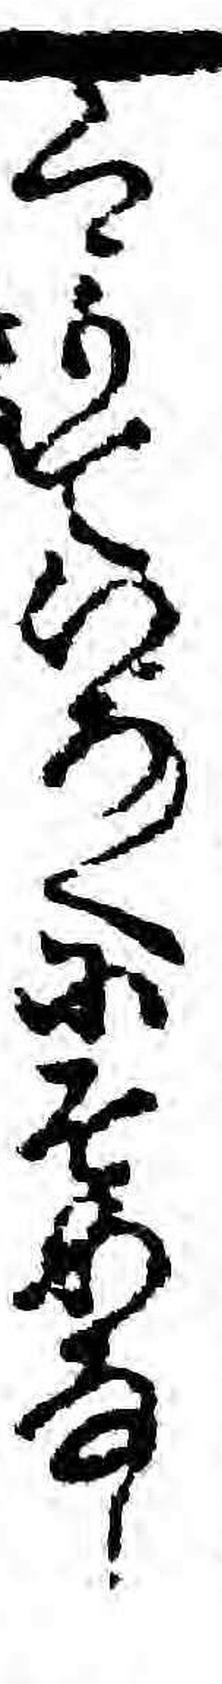くゝりていろ〳〵にそめなし
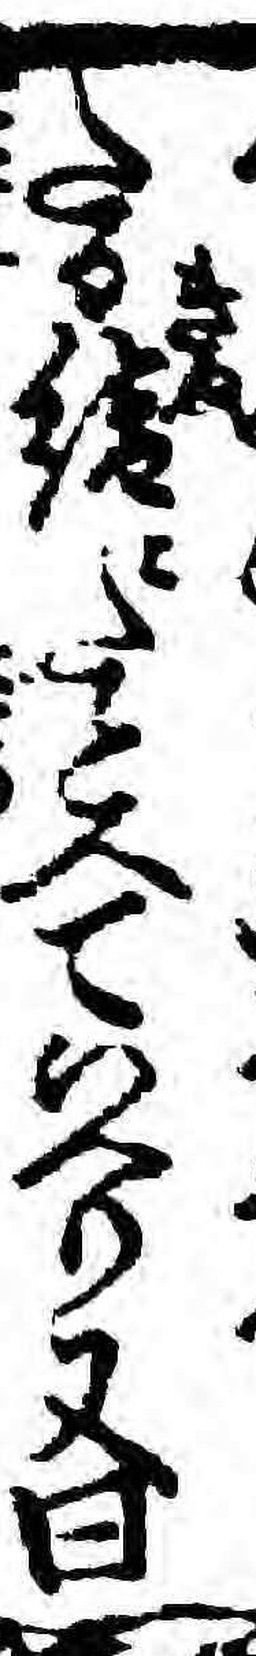たる絹にたとへていへり又曰
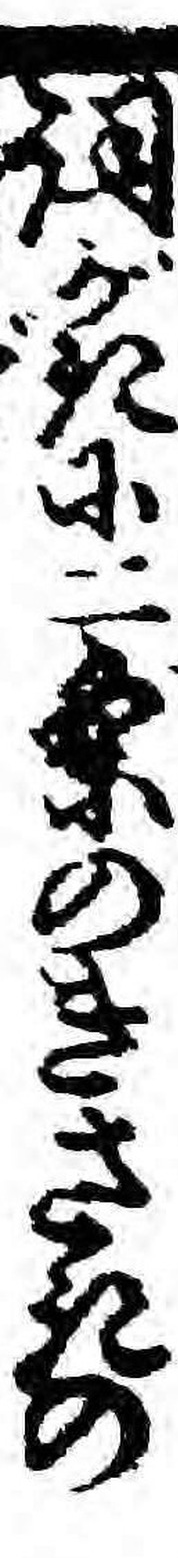詞がきに二条のきさきの
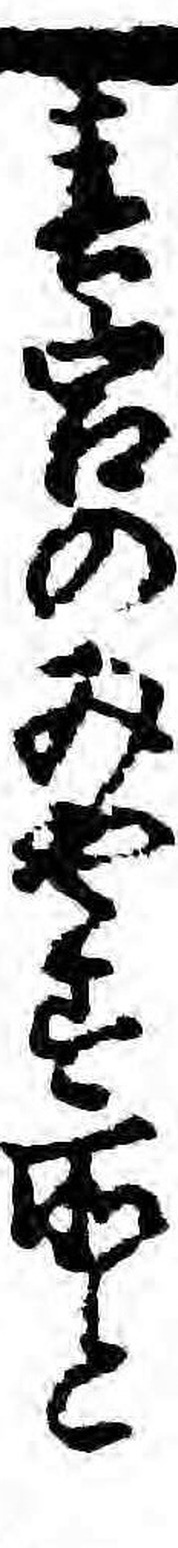春宮のみやす所と
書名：頭書和歌注譯／壽賀多百人一首小倉錦
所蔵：国文学研究資料館
